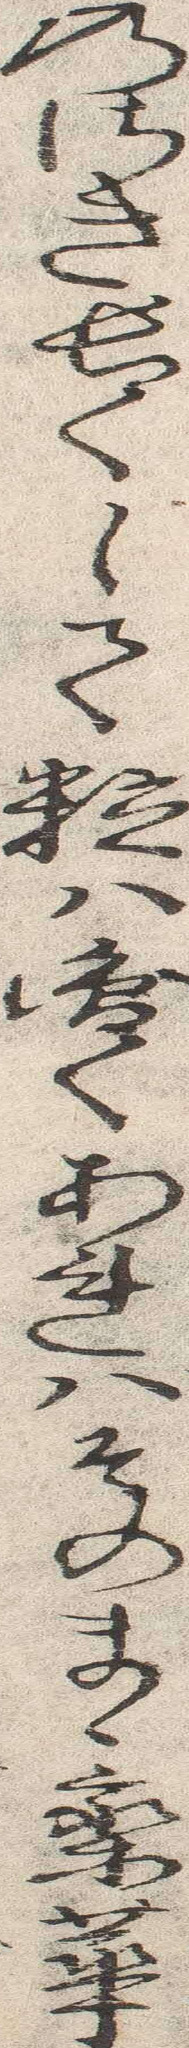のさき長くして粒は円くあればそのまゝ欒華
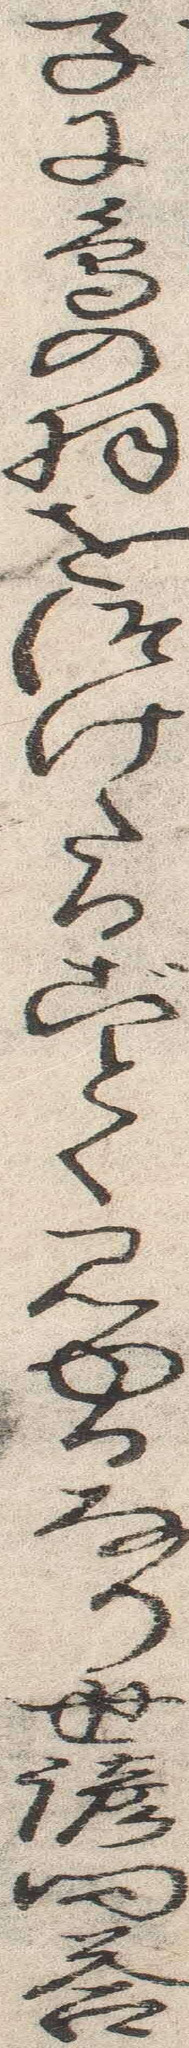子に鳥の羽をつけたるごとく見ゆる世諺問答
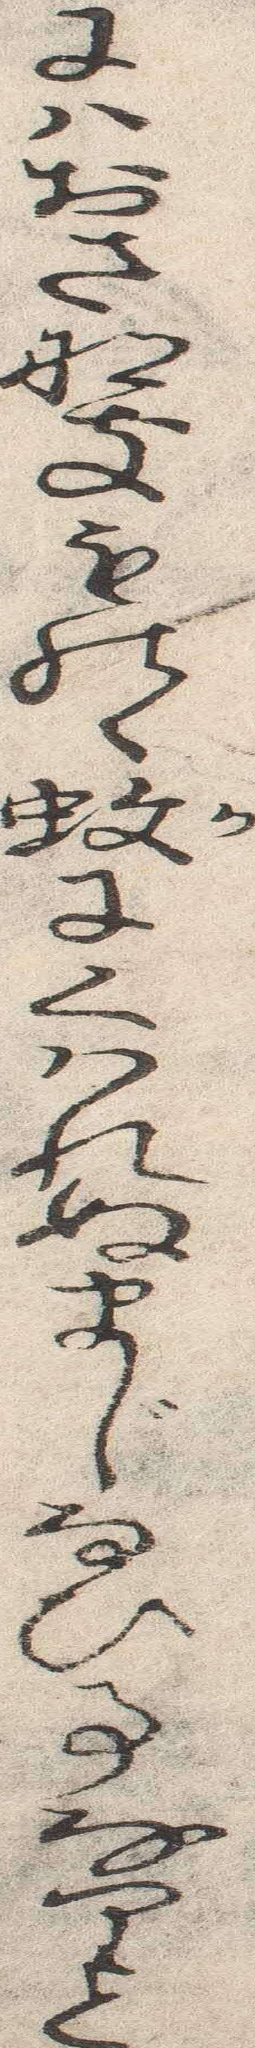にはおさなきものゝ蚊にくはれぬまじなひ事なりと
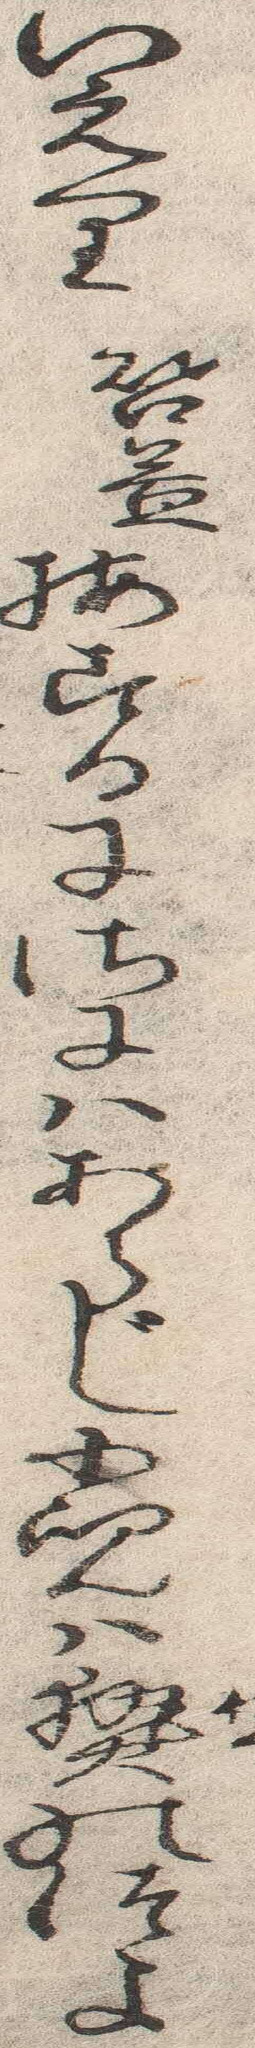いえり啓益按するにさにはあらじ小児は熱のつよ
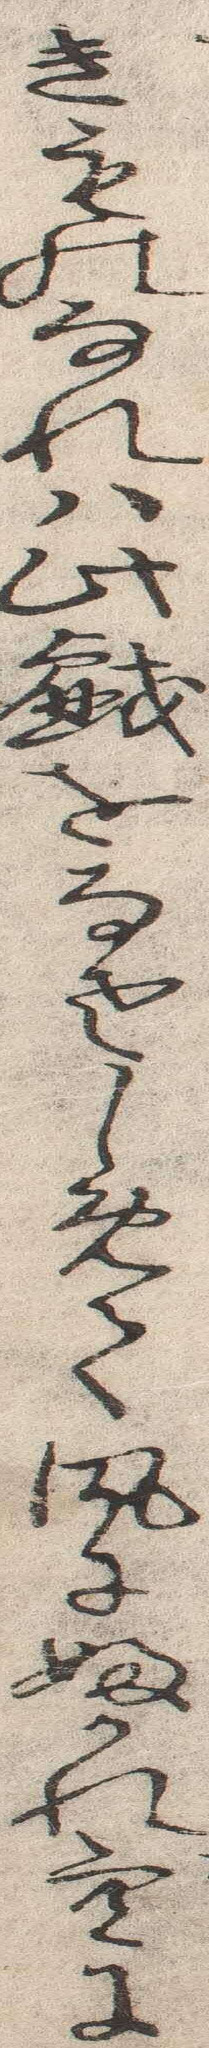きものなれは此戯をなさしめて風にふかれ空に
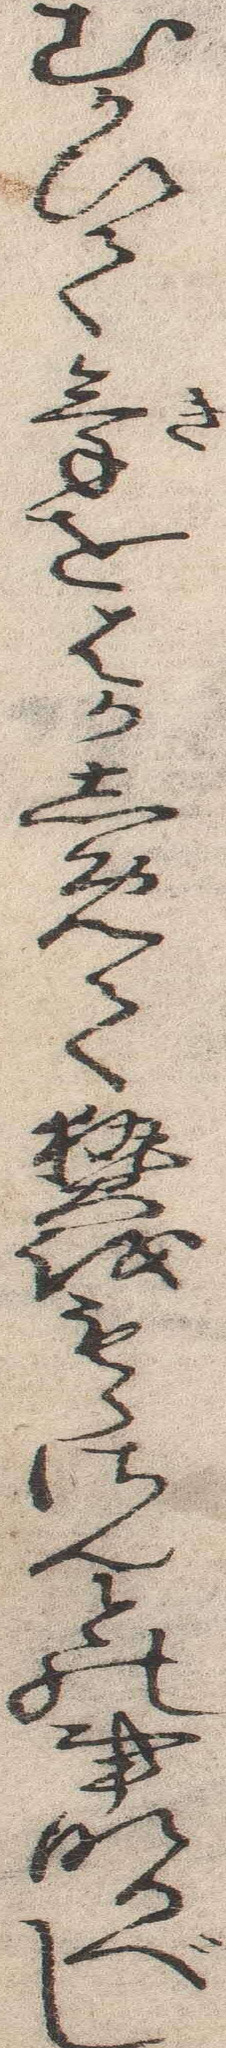むかひて気をはかしめて熱をもらさんとの事なるべし

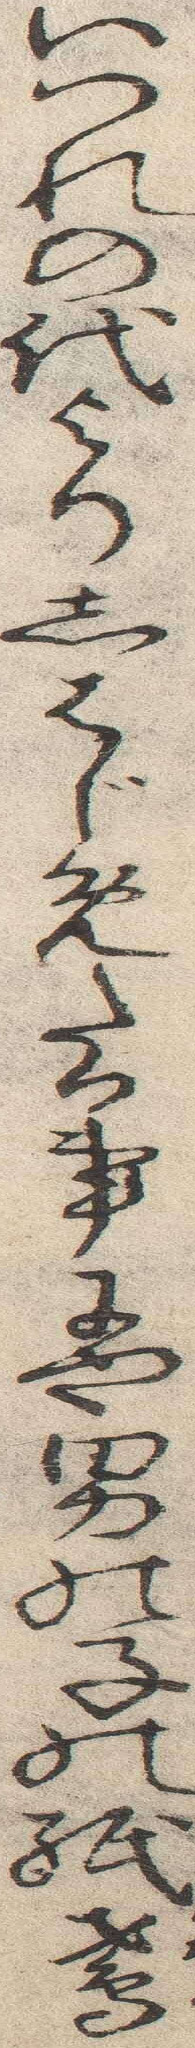いつれの代よりしはじめたる事にや男の子の紙鳶
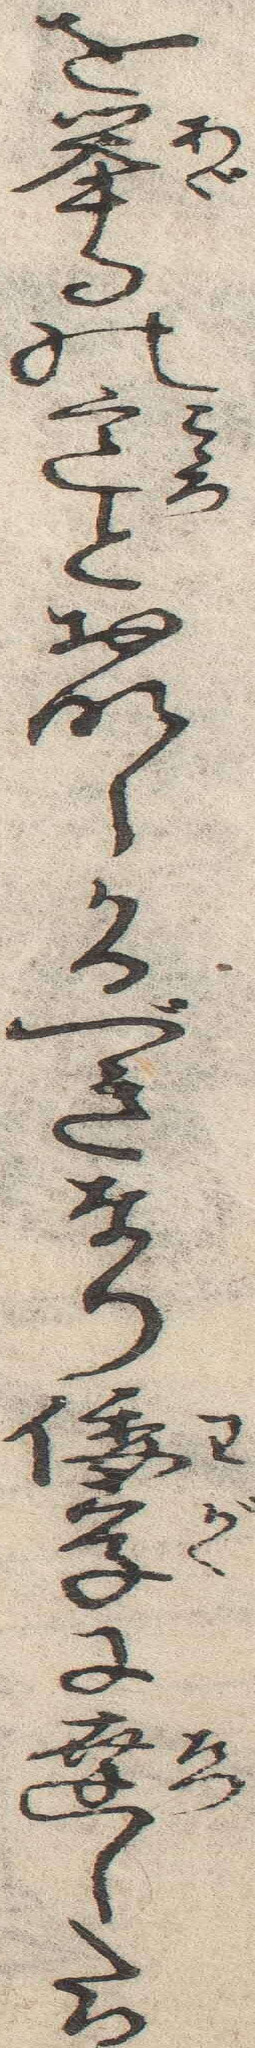を挙るの意とおなしかるべきなり倭学に達したる
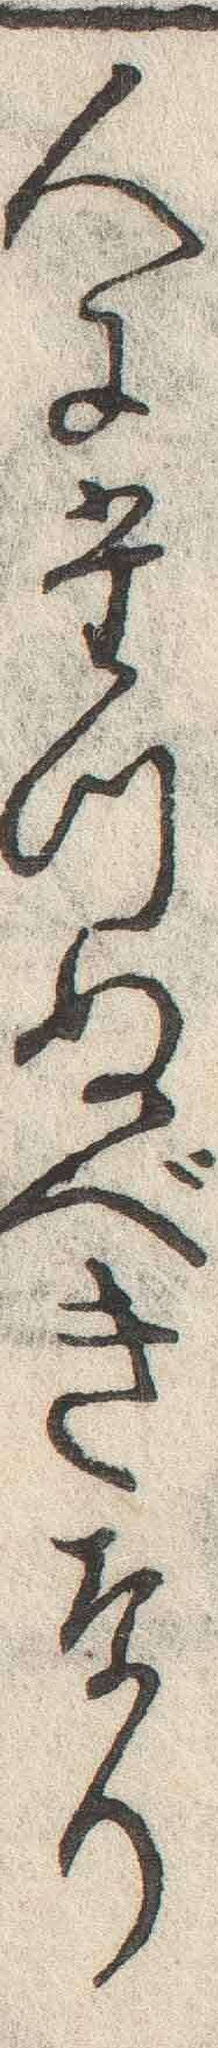人にたつぬべきなり
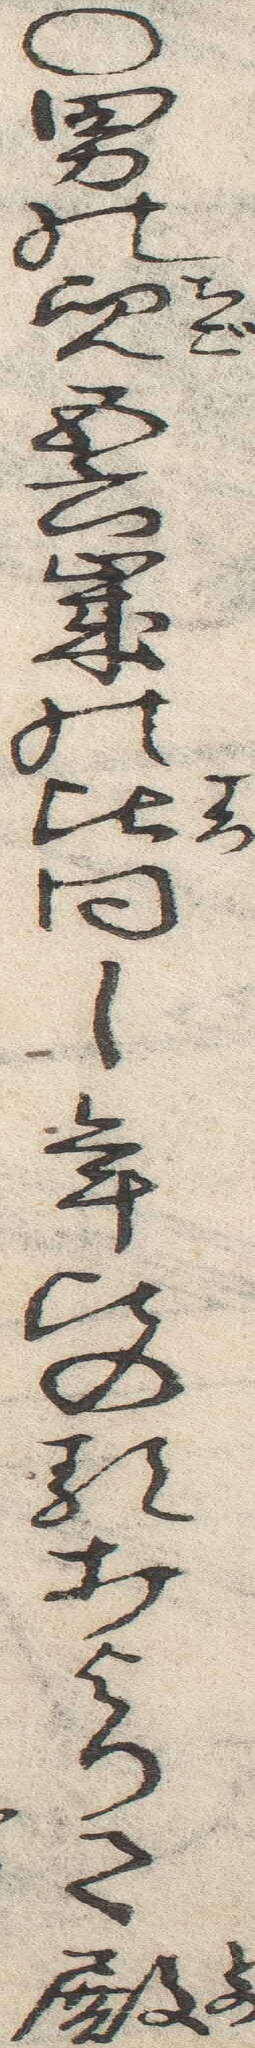○男の児五六歳の比同し年比の類打よりて殿
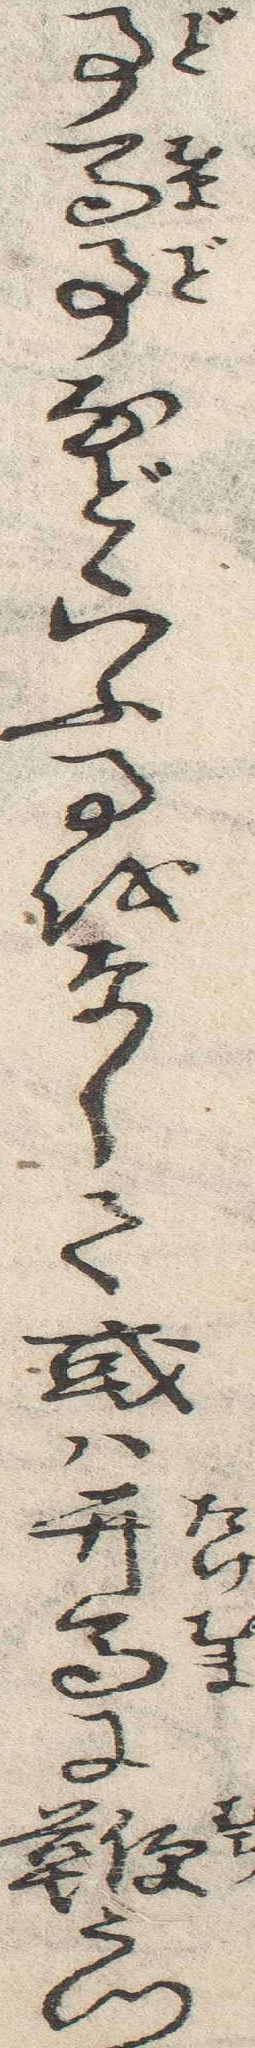事馬事などゝいふ事をなして或は竹馬に鞭うつ
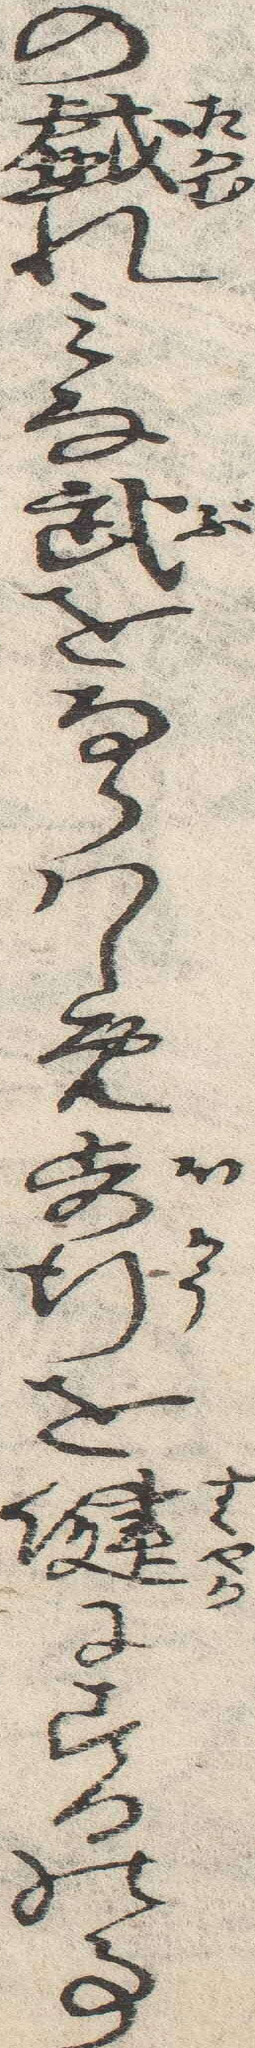の戯れみな武をならわしめ歩行を健にするの事
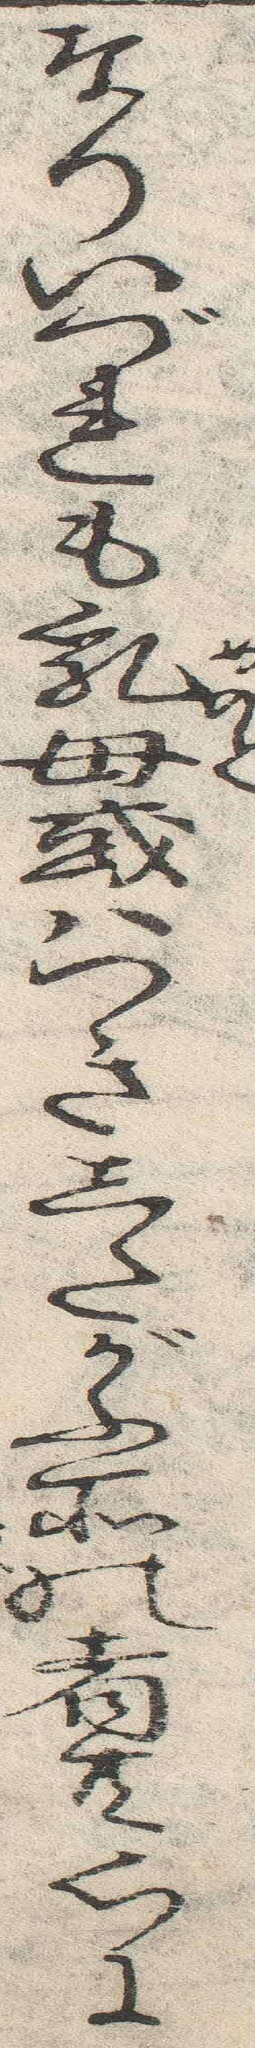なりいづれも乳母或はつきしたがふ所の者共心に
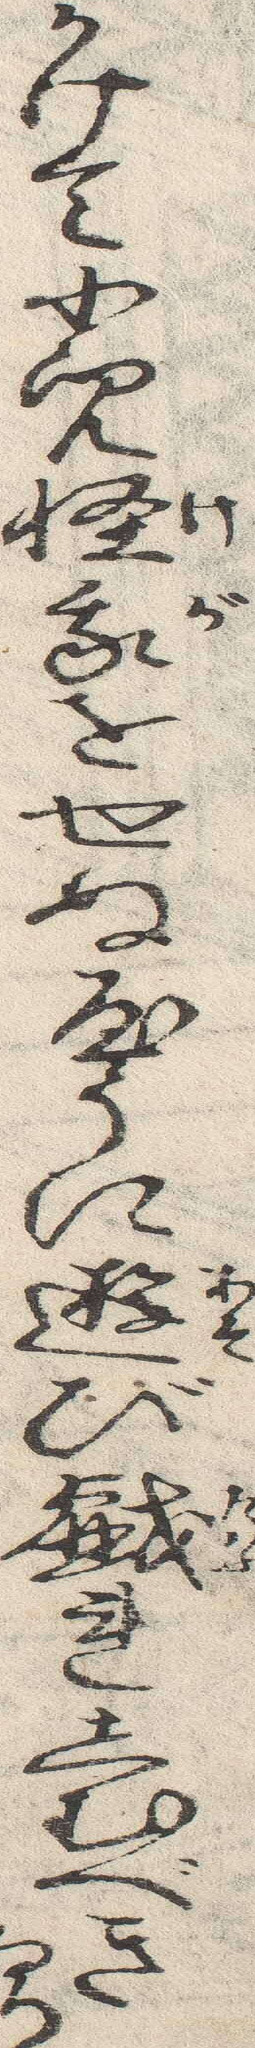かけて小児怪我をせぬやうに遊び戯れしむべきなり
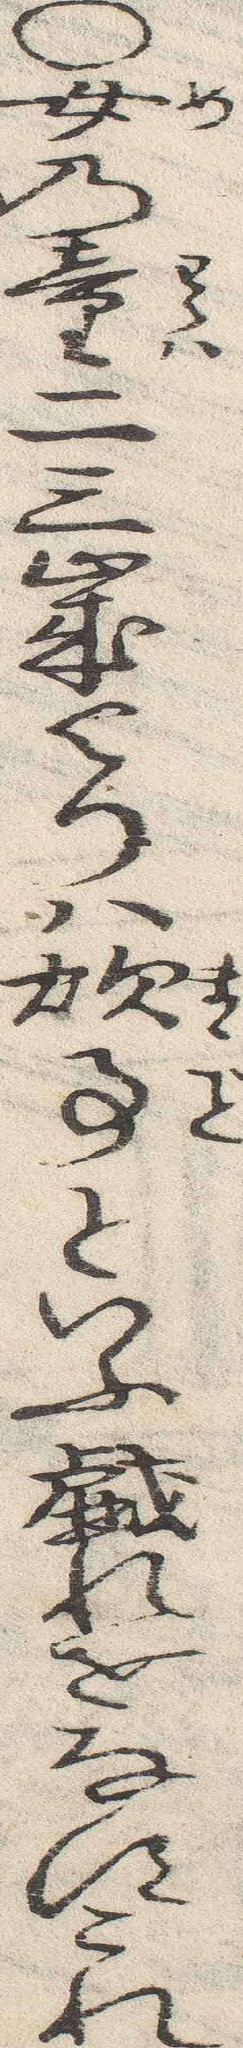○女の童二三歳よりは炊事といふ戯れをなすこれ
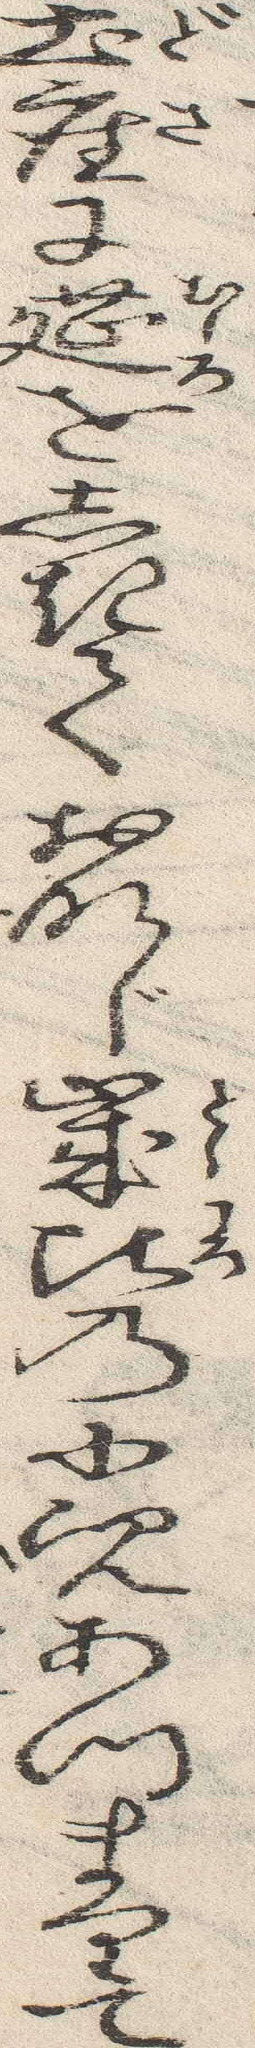土座に筵をしきておなじ歳比の小児あつまりて
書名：小児必用養育草
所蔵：東京学芸大学附属図書館 国文学研究資料館
